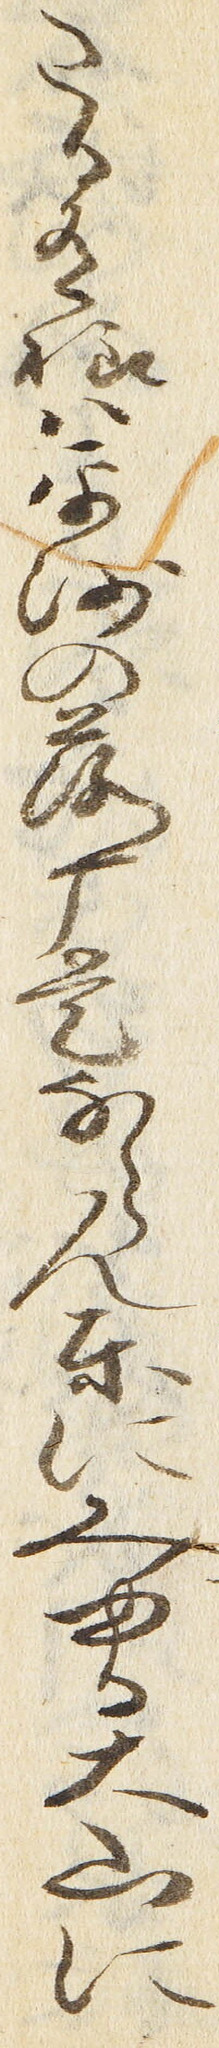たる有様は平沙の落雁是ならん東にみゆる大山に
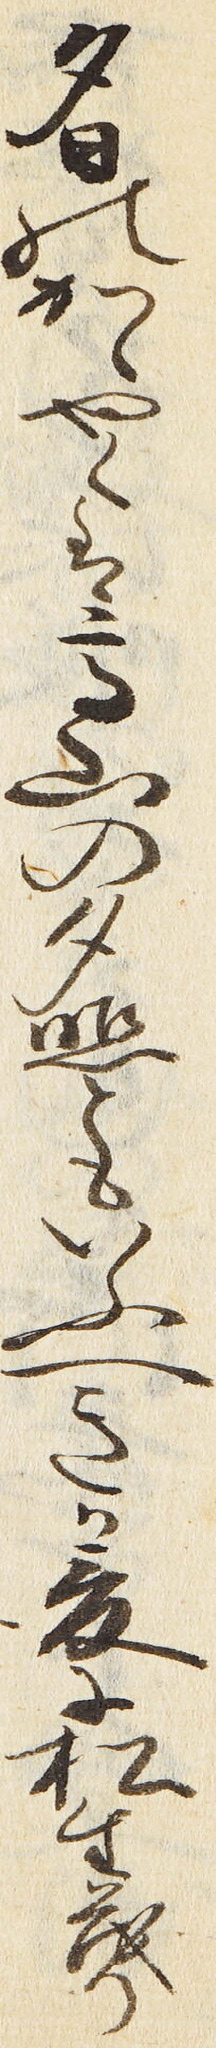夕日のかゝやくは高山の夕照ともいふへきか爰に松生茂り
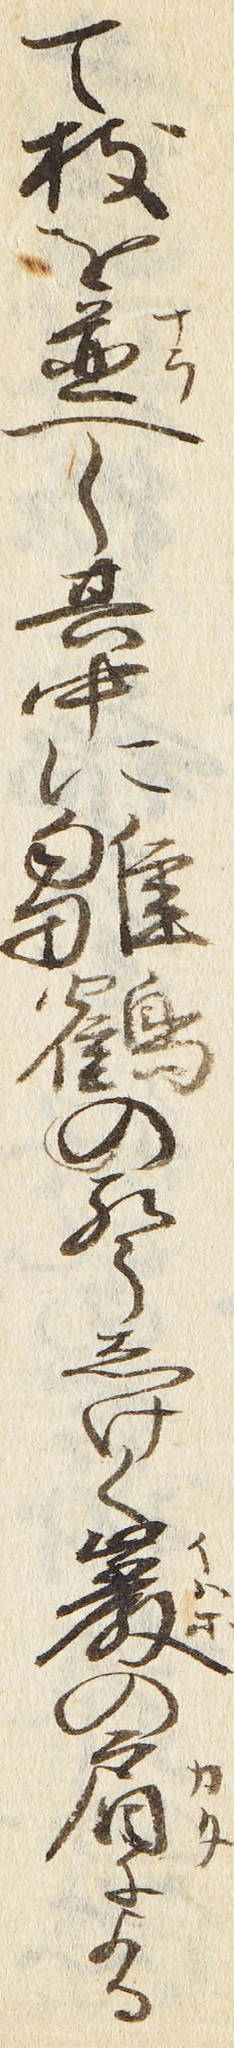て枝を並へし其中に雛鶴の声しけく巌の肩による
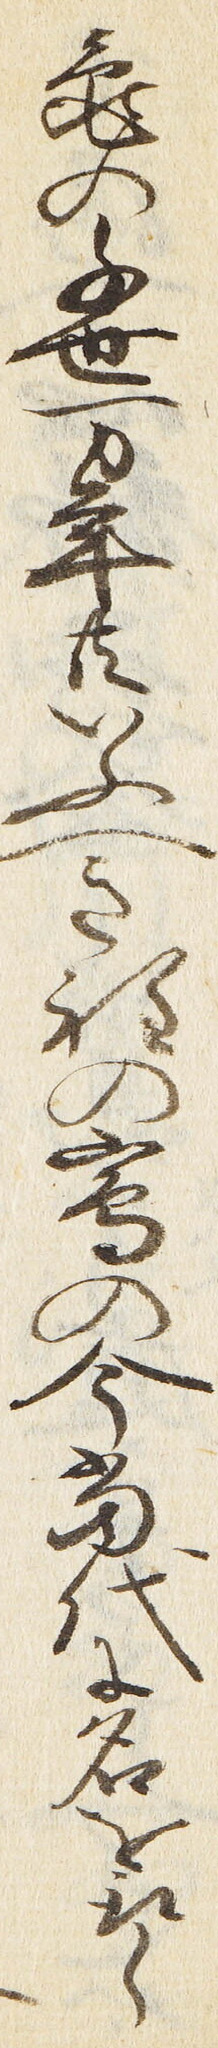亀の千世万年共いふへき程の嶋の今当代に名を取し
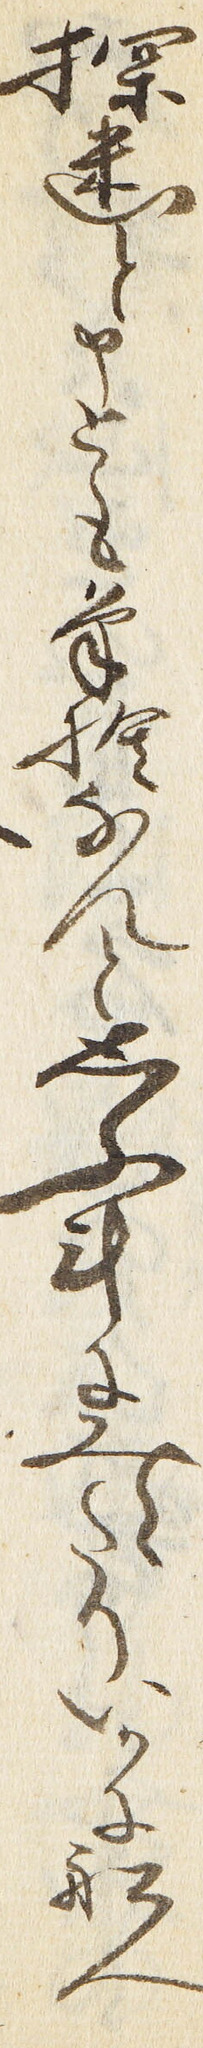探幽と申とも筆捨なんと思ふ計にみえたりいかに船人
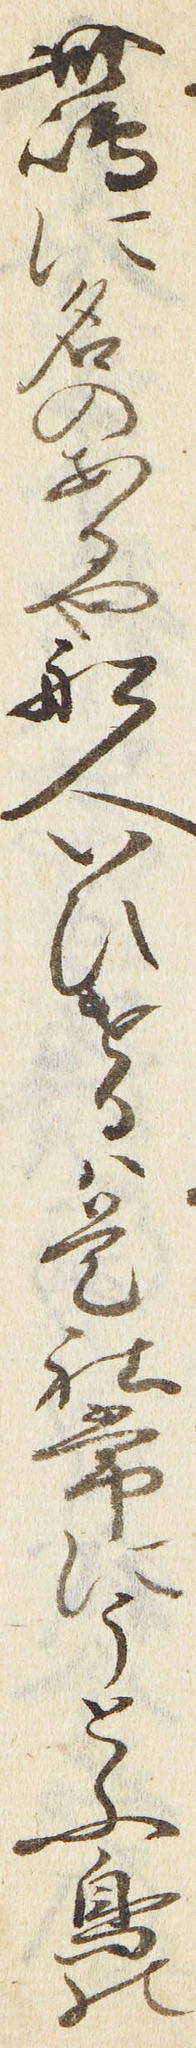此嶋に名のあるや船人いひけるは是社常にうとふ鳥の
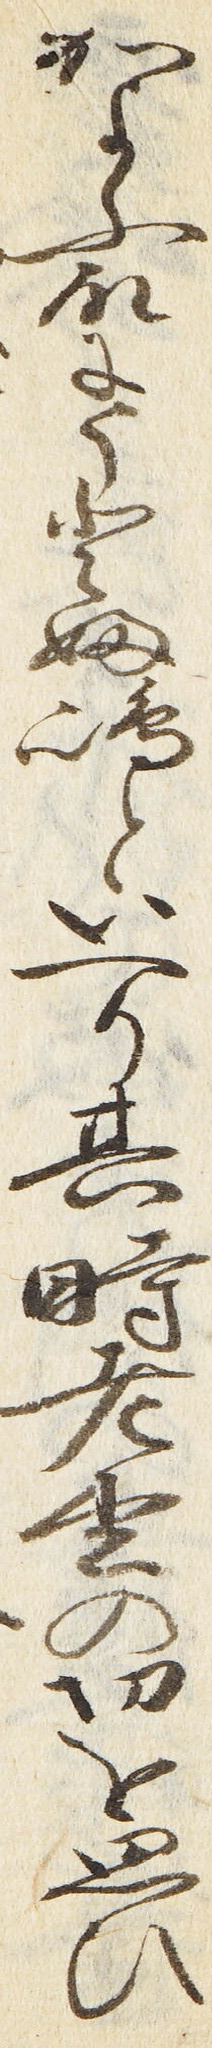かよふ故にうとふ嶋といへり其時老松の切を思ひ
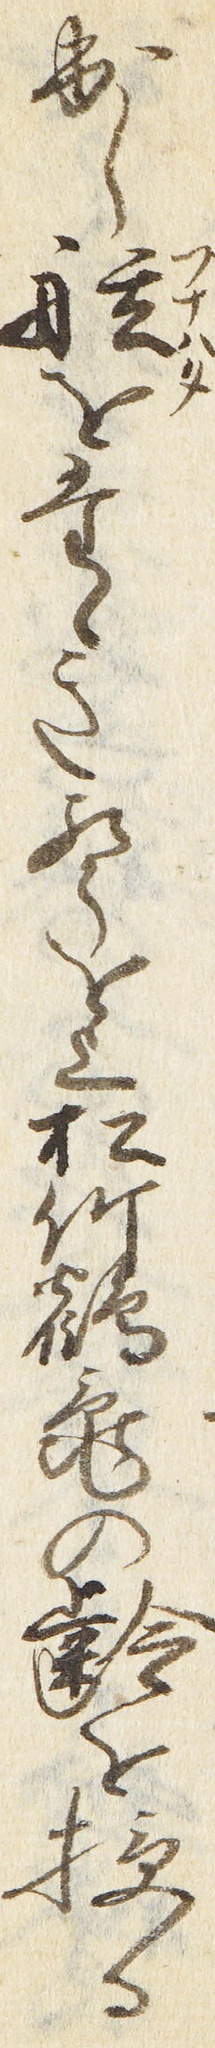出し舷をたゝき声を上松竹鶴亀の齢を授る
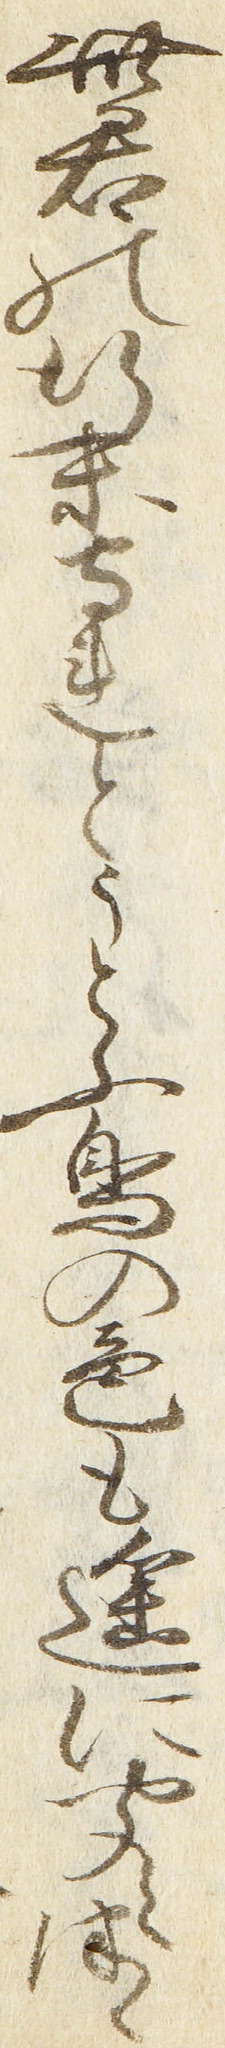此君の行末守れとうとふ鳥の声も遥に聞えつゝ
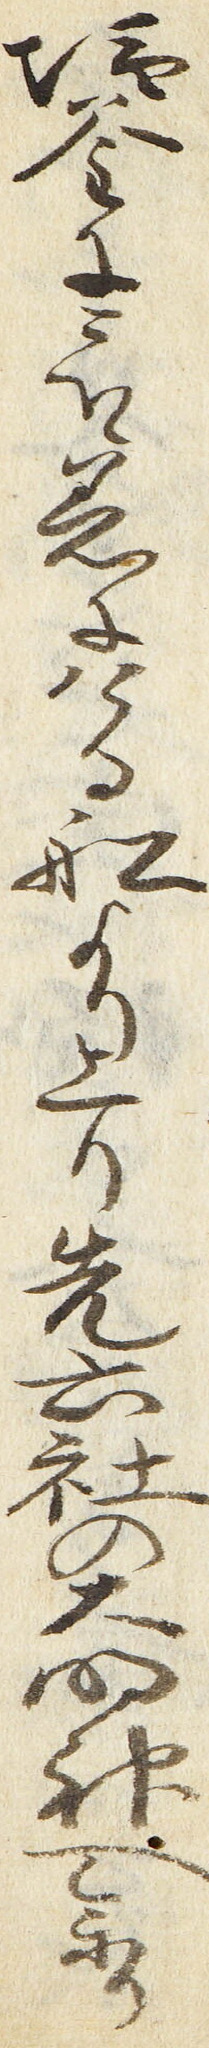塩釜にこそ着にける船より上り先六社の大明神へ参り

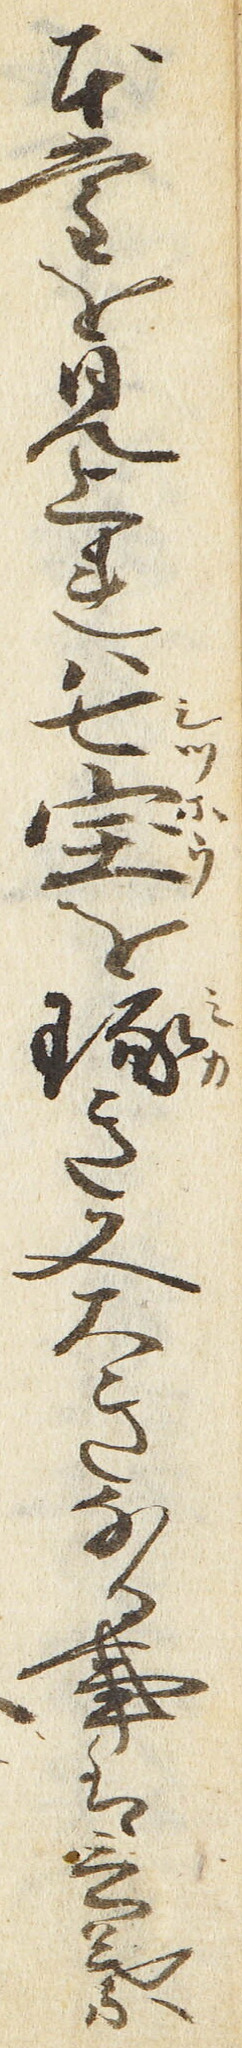本堂を見上れは七宝を琢き又大きなる事は言葉
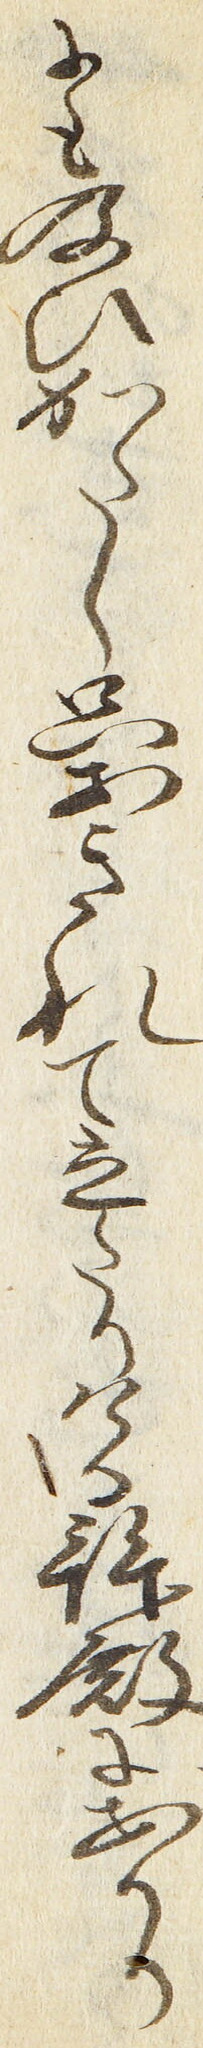にも及ひかたし只あきれて立たりける拝殿にあかり
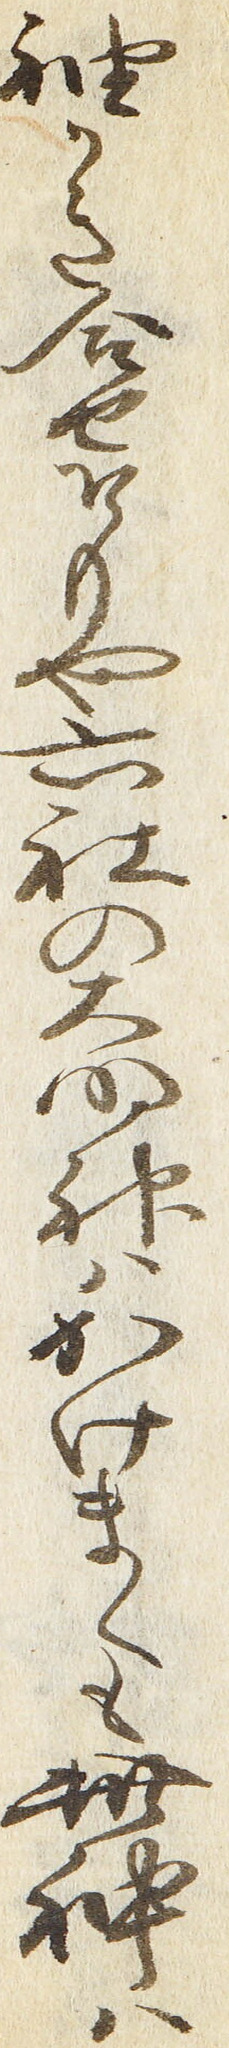袖かき合せそもや六社の大明神はかけまくも此神は
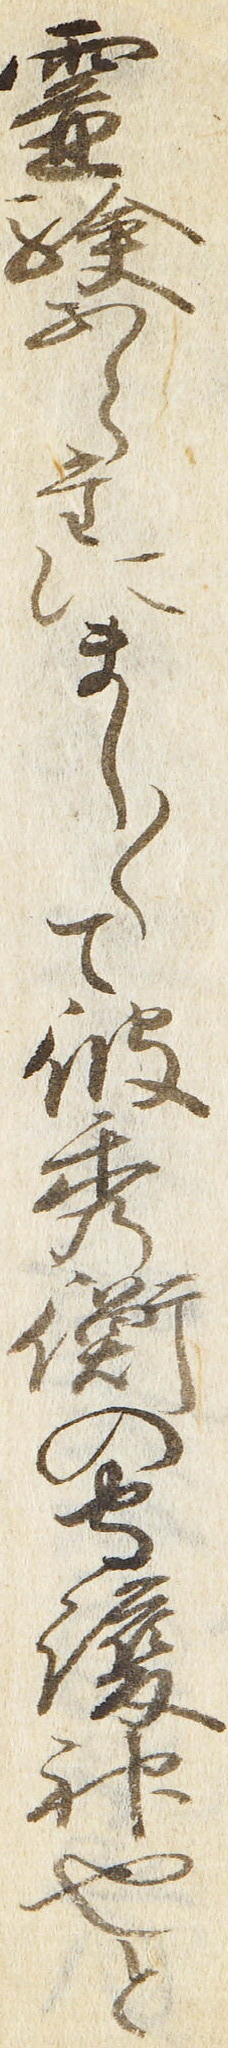霊験あらたにまし〳〵て彼秀衡の守護神也と
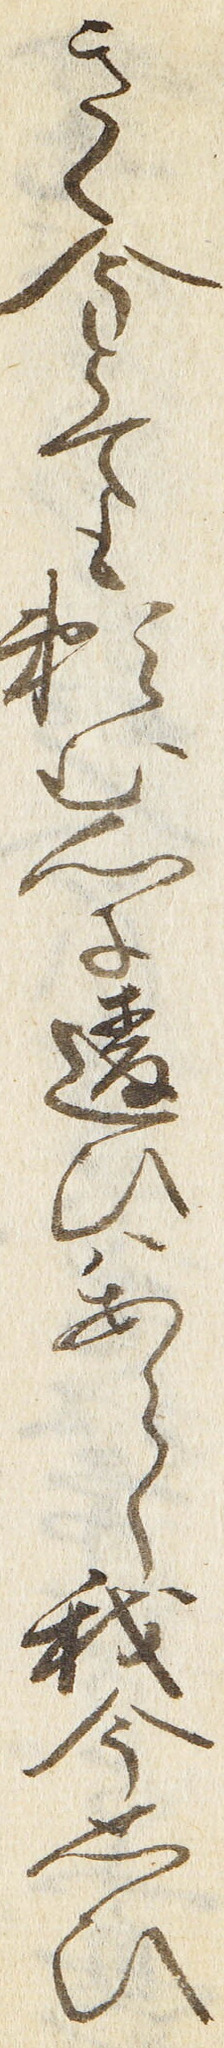きく今とても頼む心に違ひはあらし我今思ひ
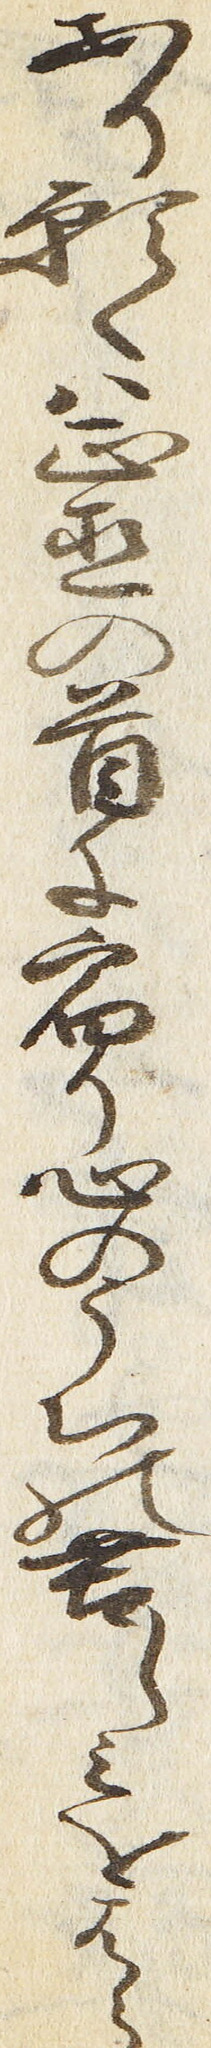あり願くは正直の首に宿り心のうちの苦しみをはら
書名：海陸世話日記
